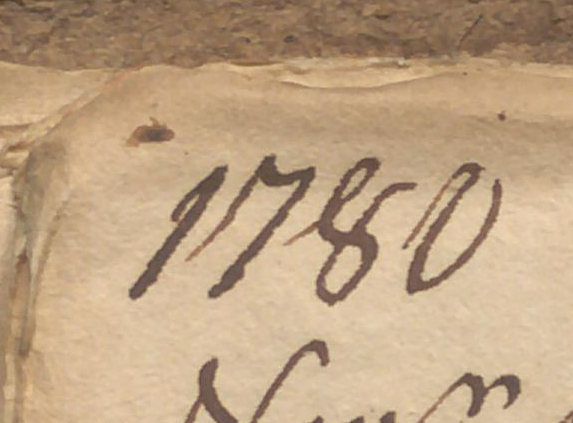1780
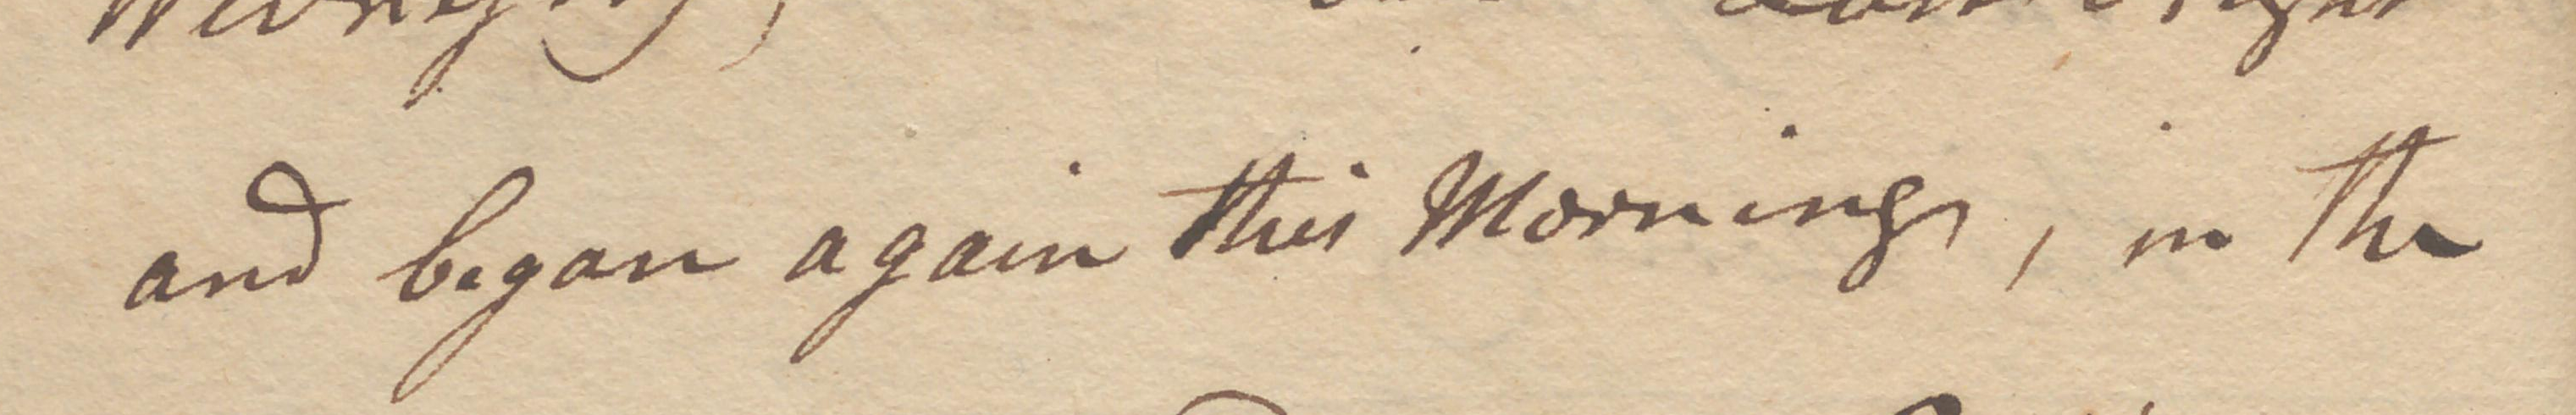and began again this Mornings, in the
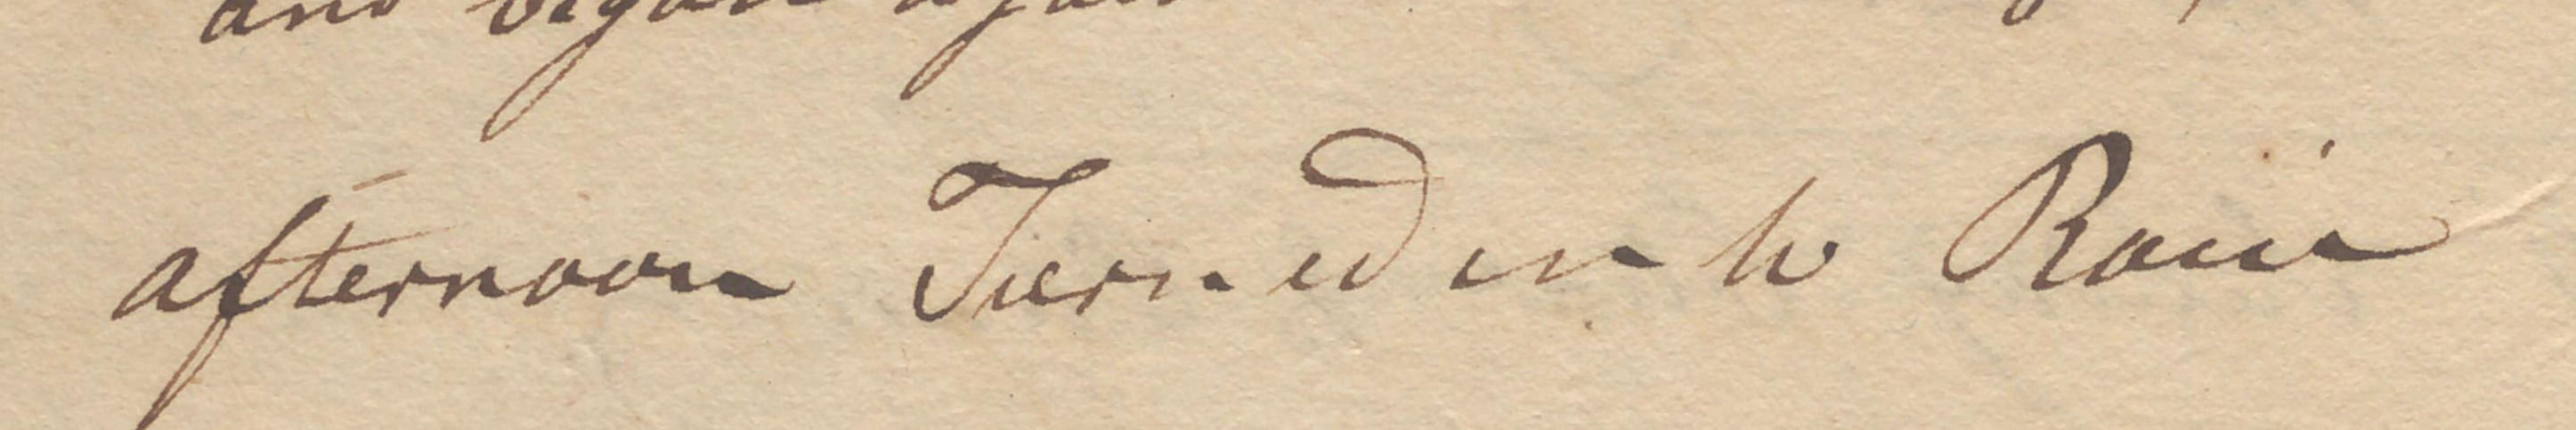afternoon Turned in to Rain
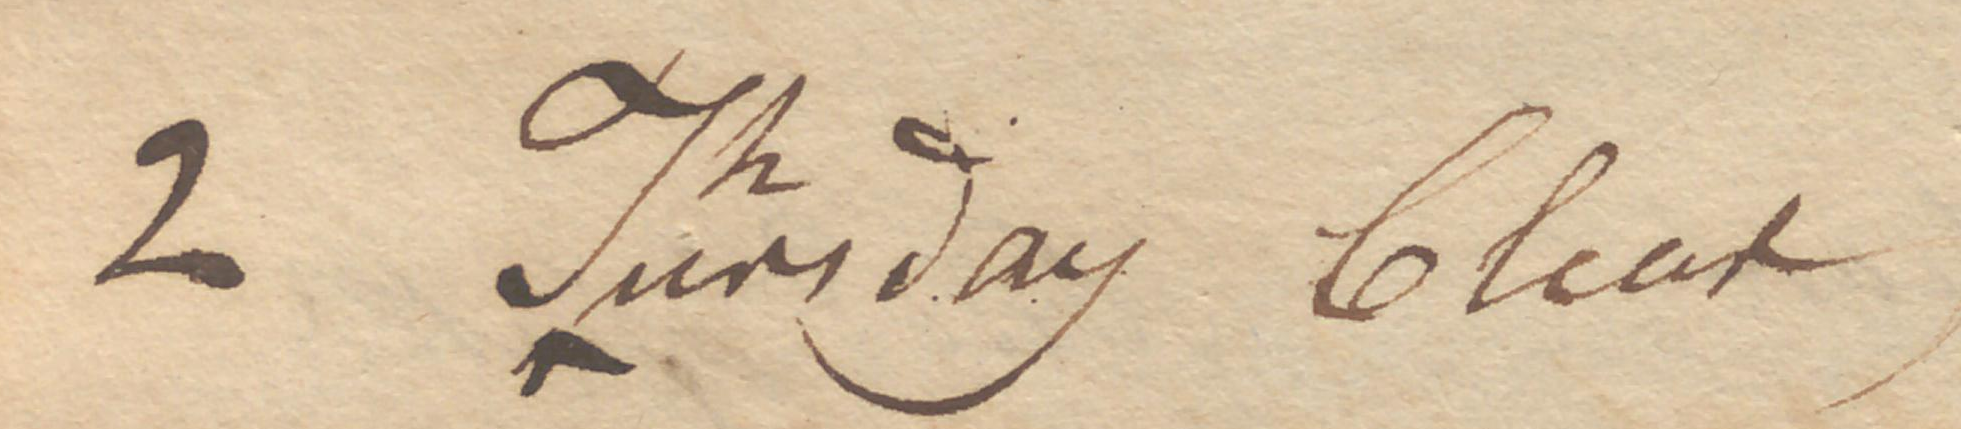2 T^hursday Clear
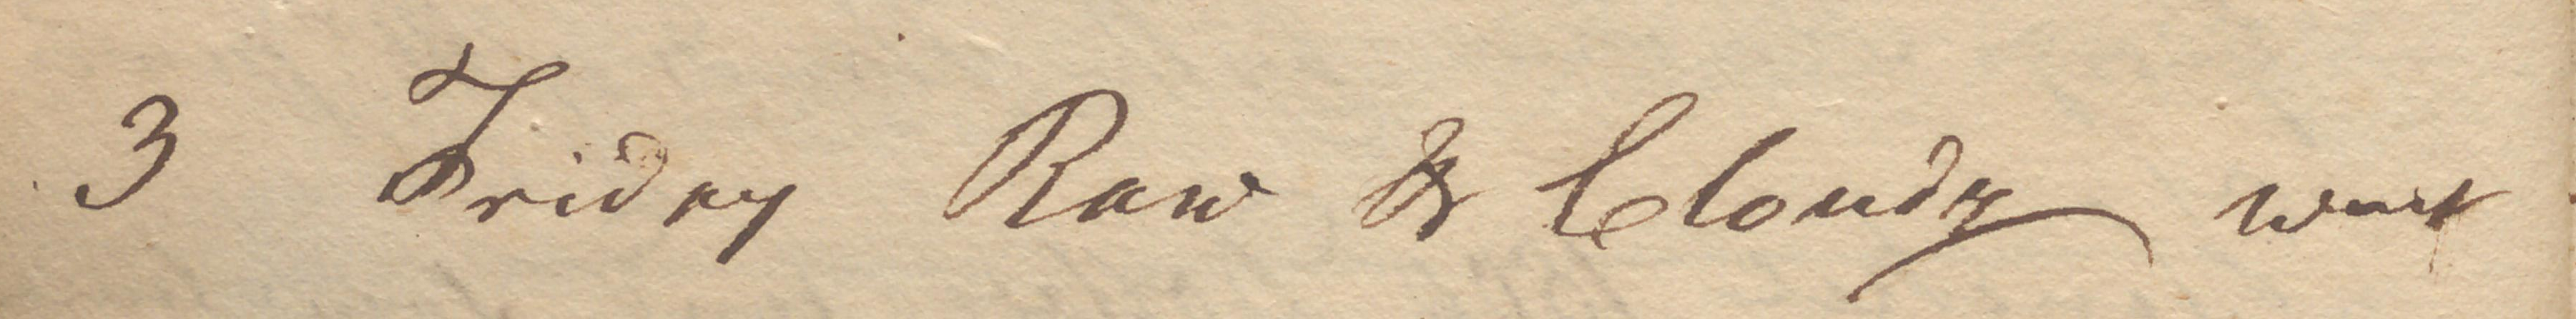3 Friday Raw & Cloudy went
